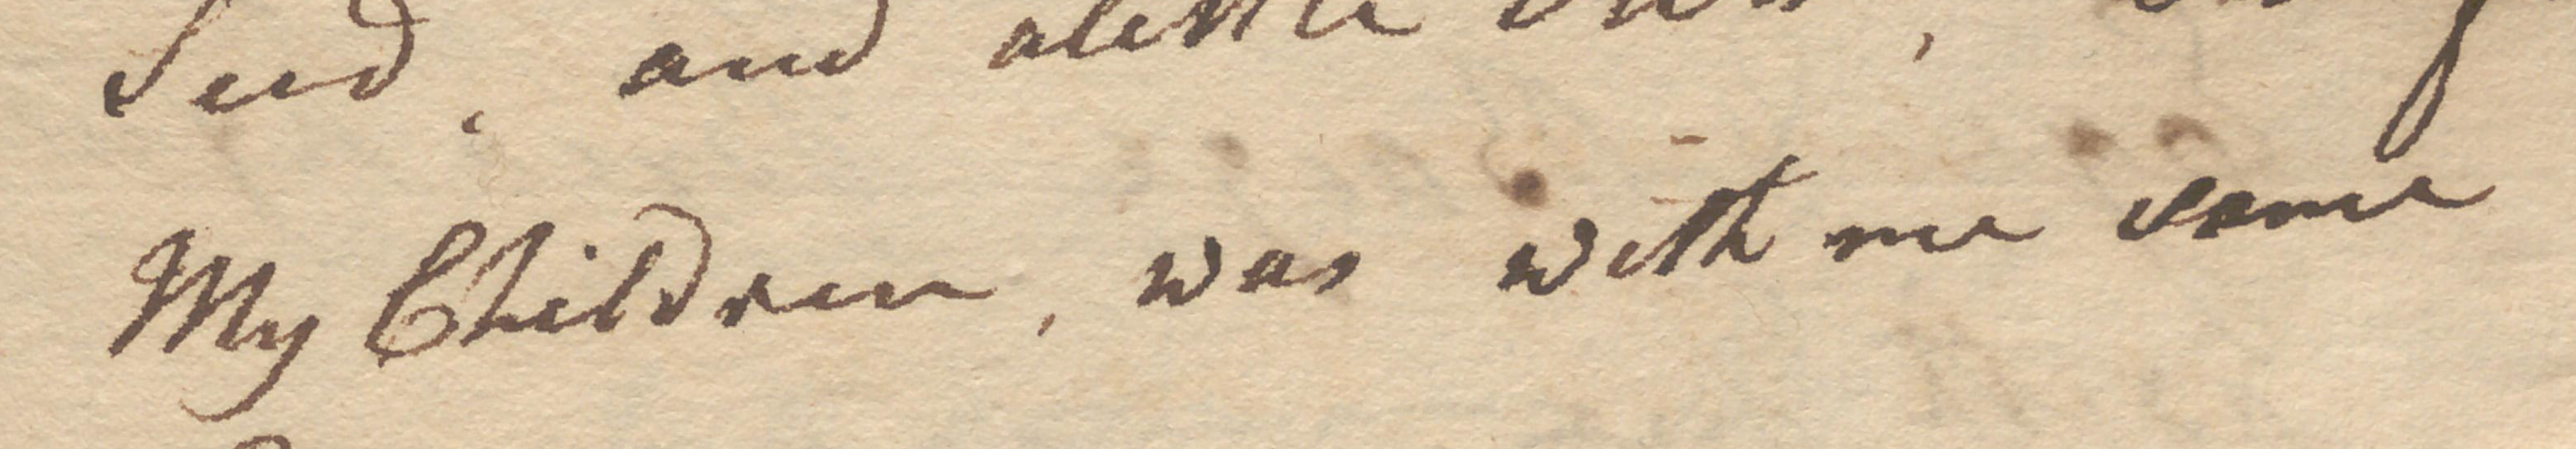My Children, was with me same
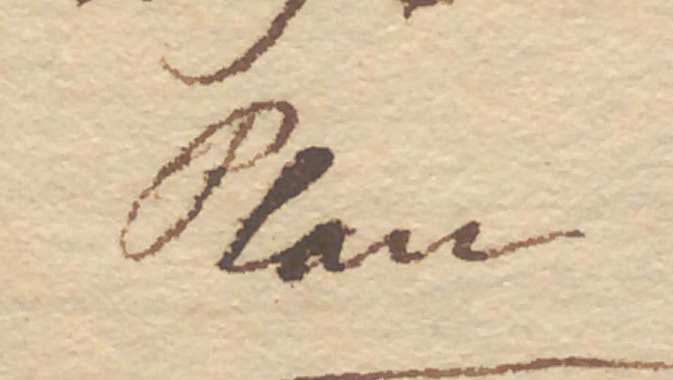Plan
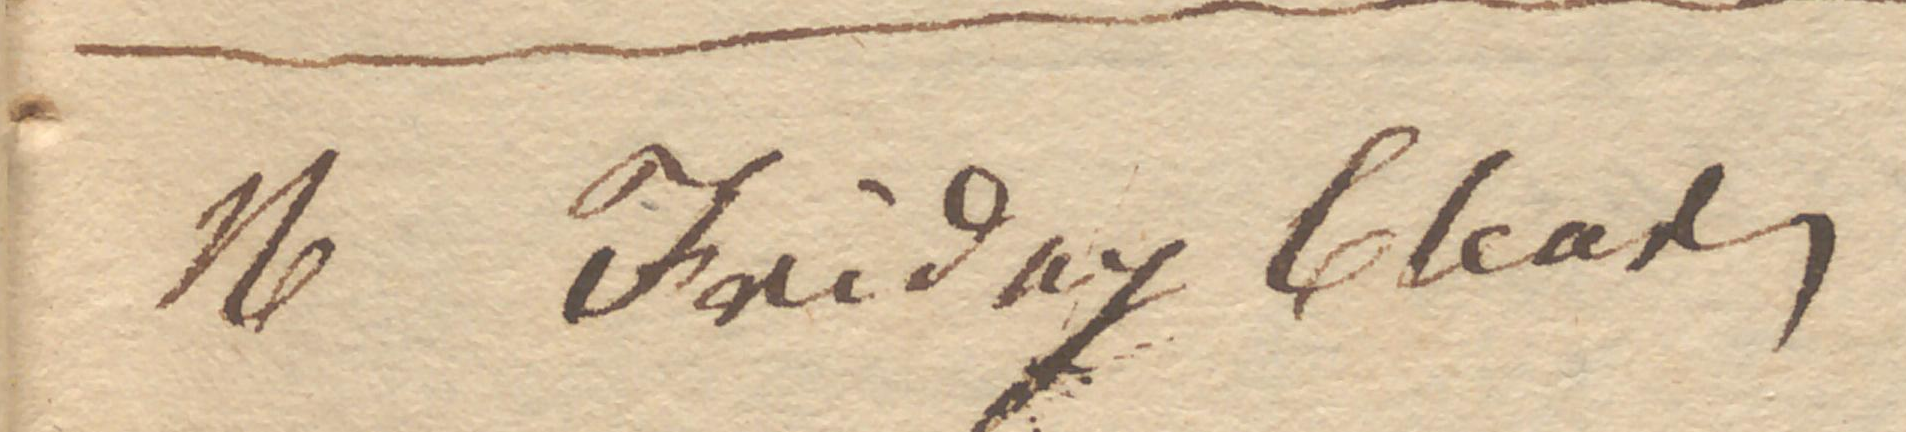16 Friday Clear
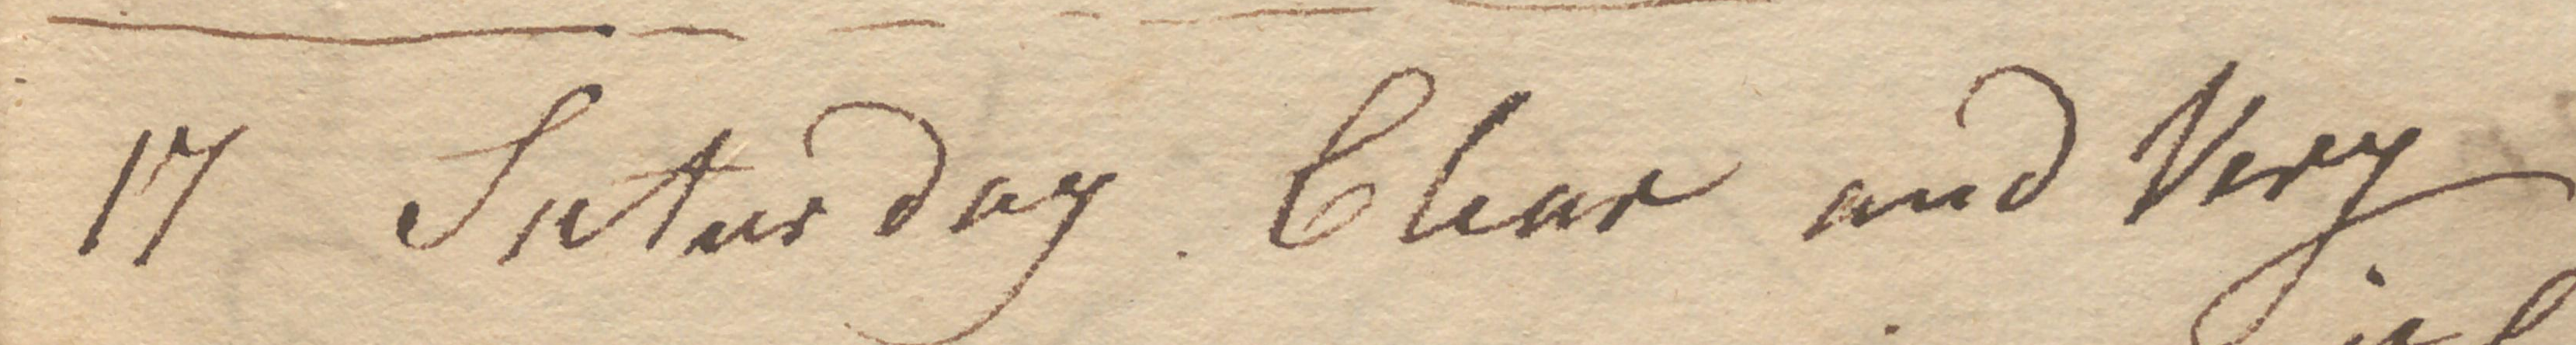17 Saturday Clear and Very
